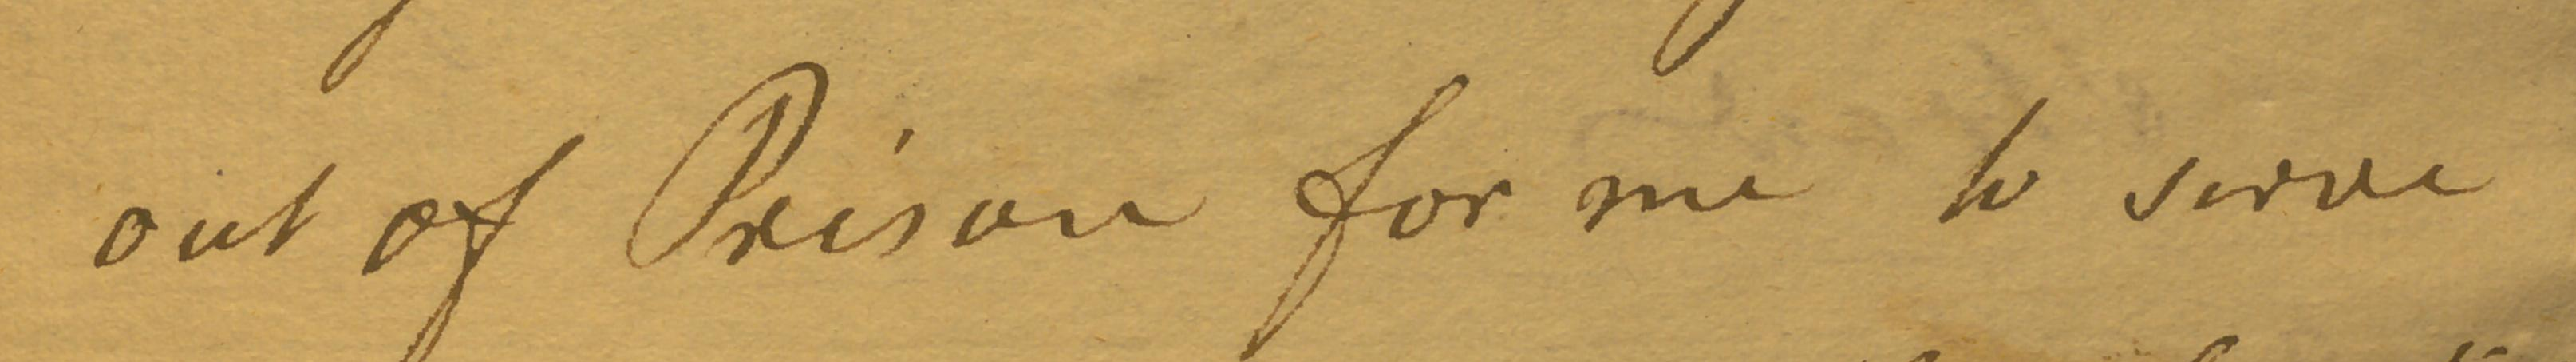out of Prison for me to serve
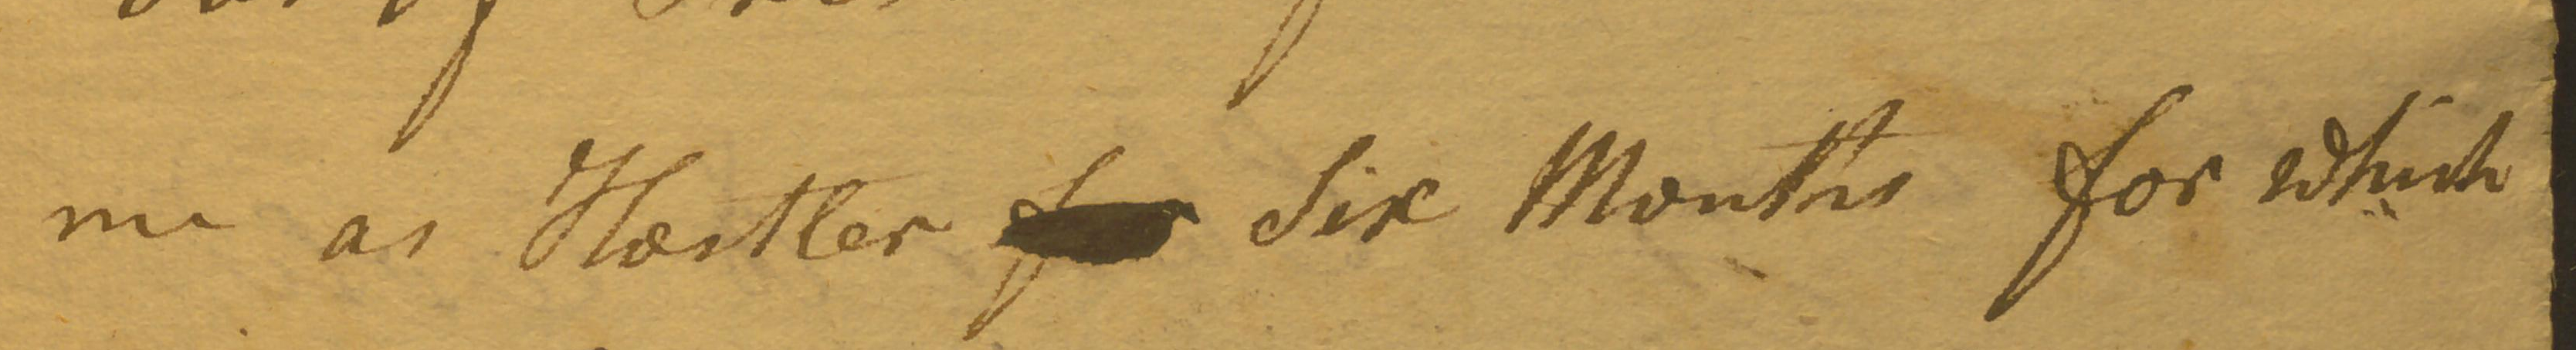me as Hostler [for] six Months for which
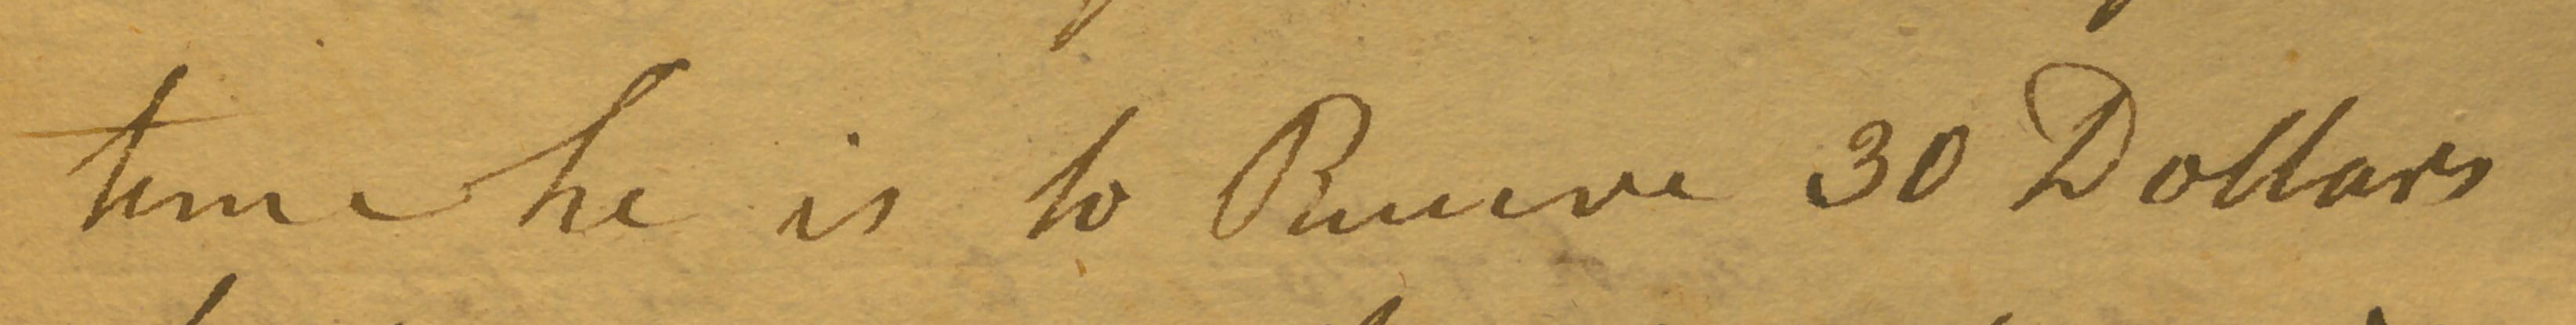time he is to Receive 30 Dollars
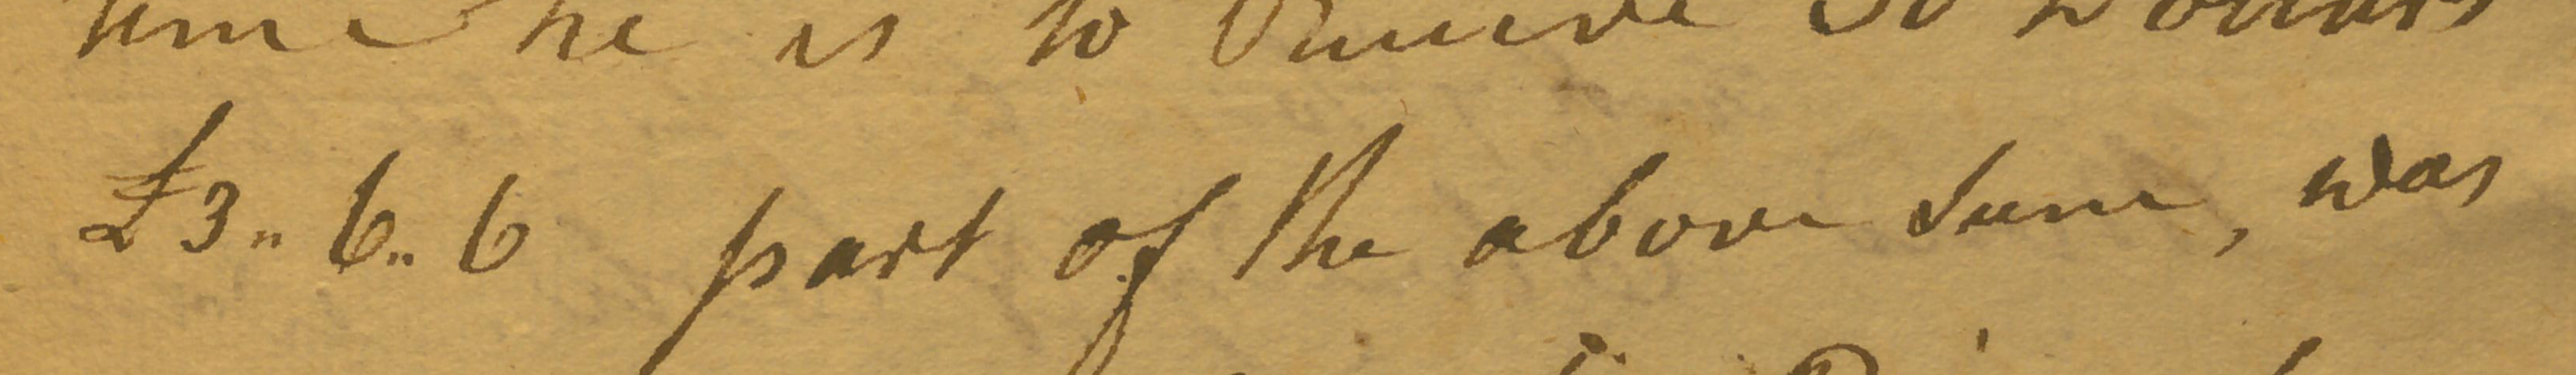£3..6..6 part of the above sum, was
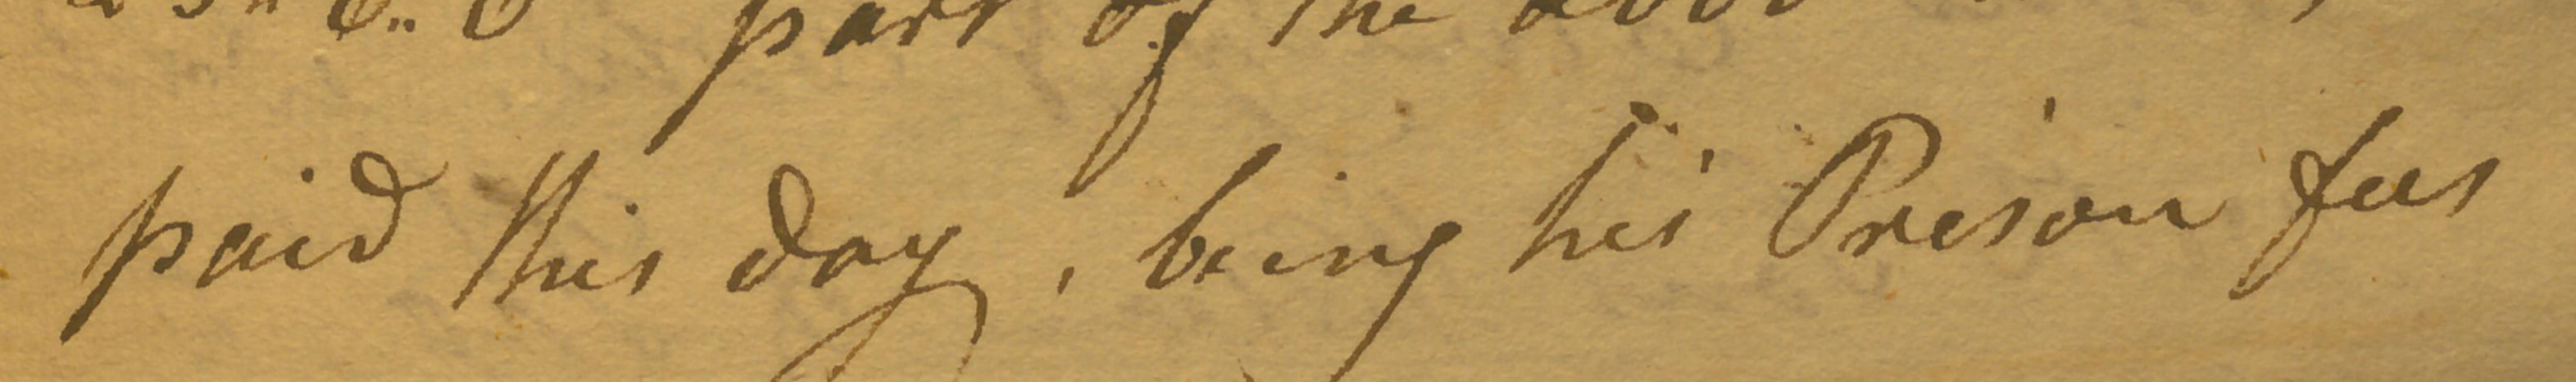paid this day. being his Prison fees
